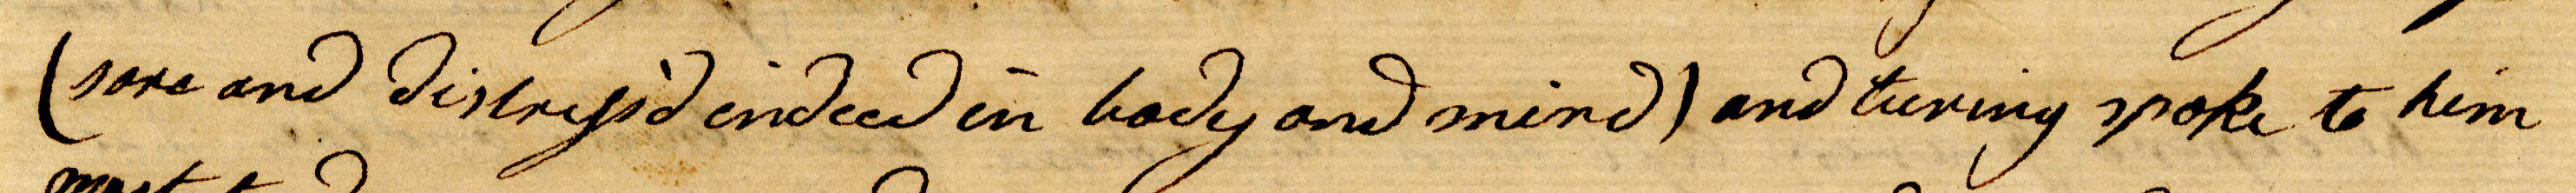(sore and distress'd indeed in body and mind) and turning spoke to him
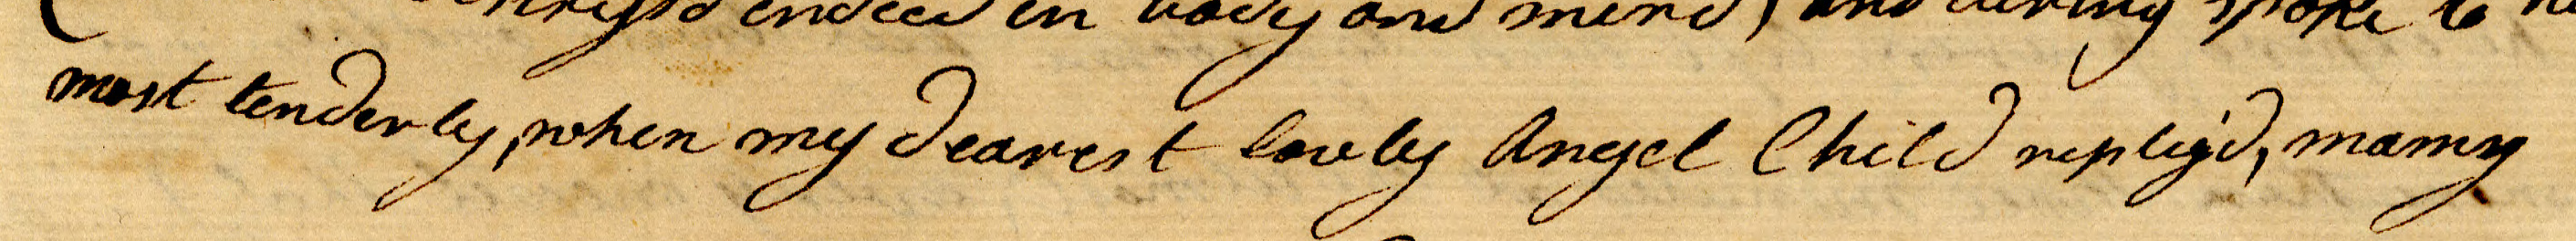most tenderly, when my dearest lovly Angel Child reply'd, mamy
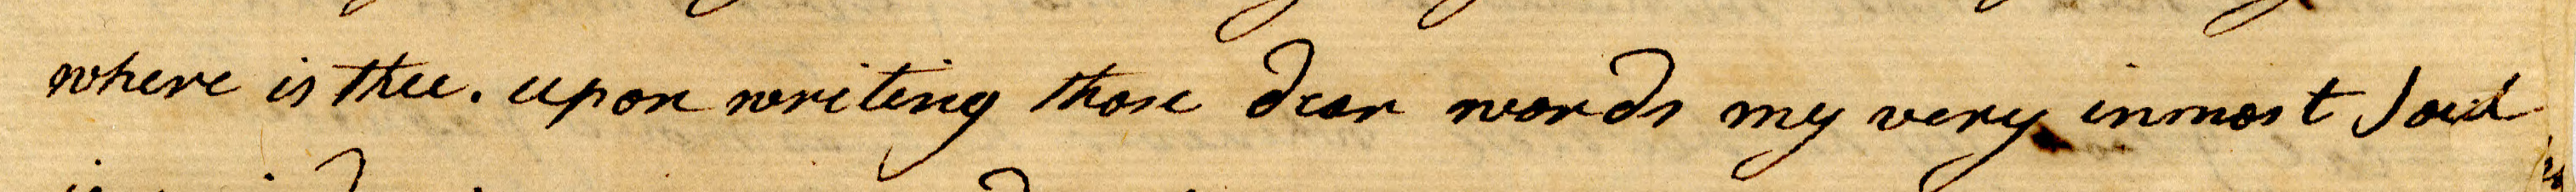where is thee. upon writing those dear words my very inmost Soul
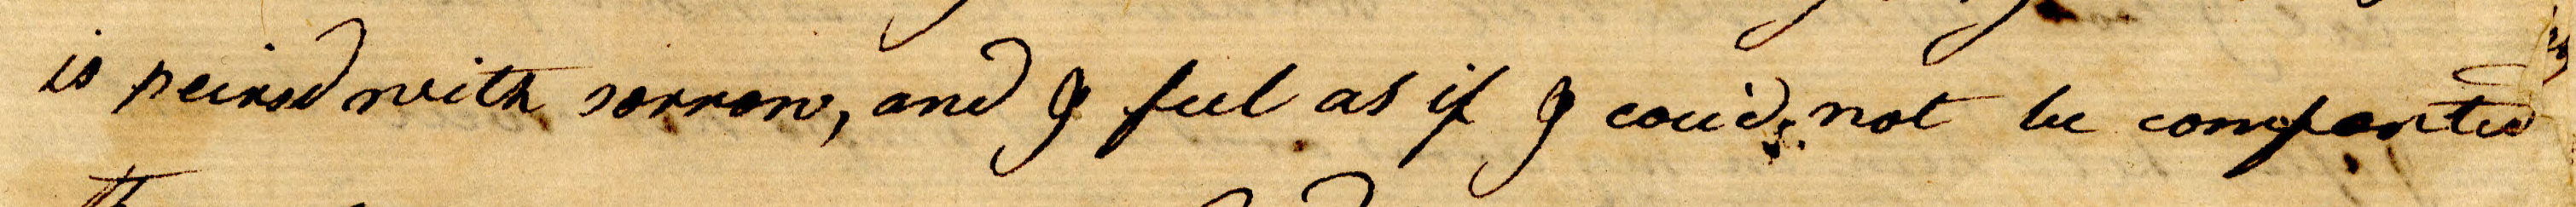is peirsd with sorrow, and I feel as if I cou'd not be comforted
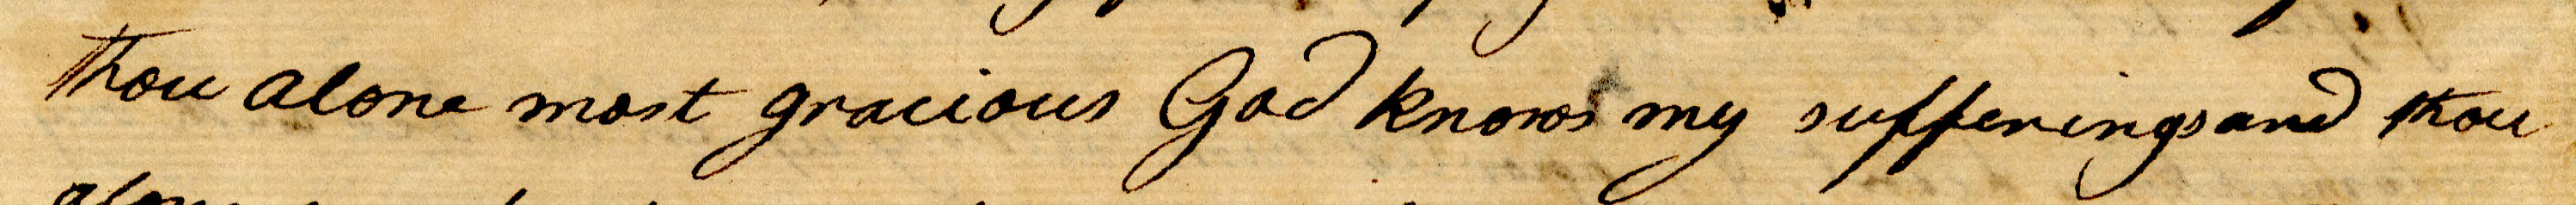thou alone most gracious God knows my sufferings and thou
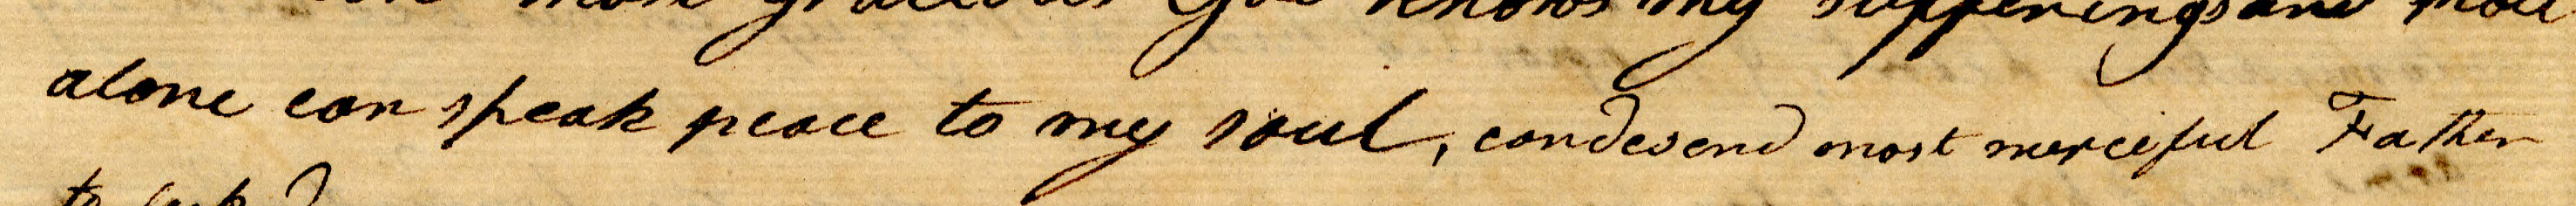alone can speak peace to my soul, condesend most merciful Father
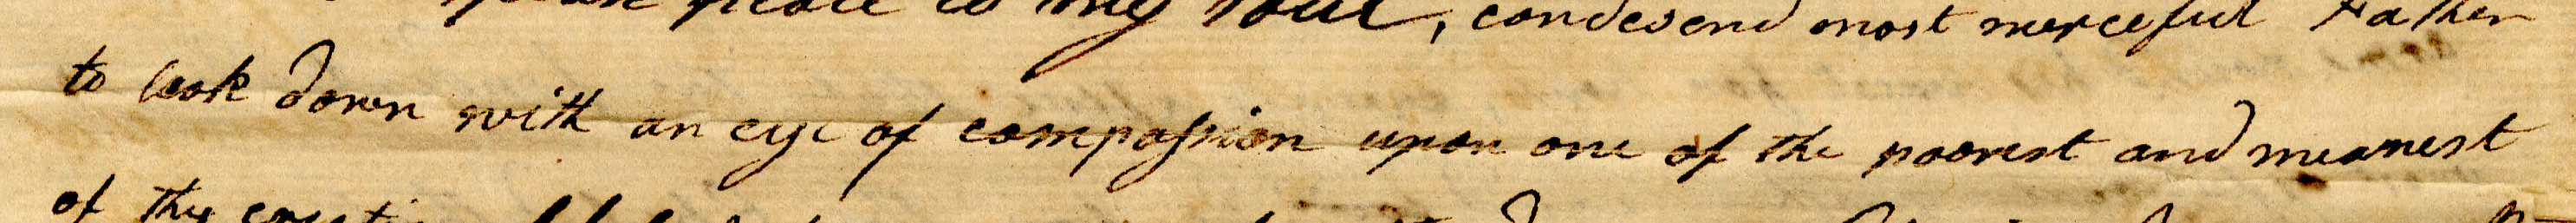to look down with an eye of compassion upon one of the poorest and meanest
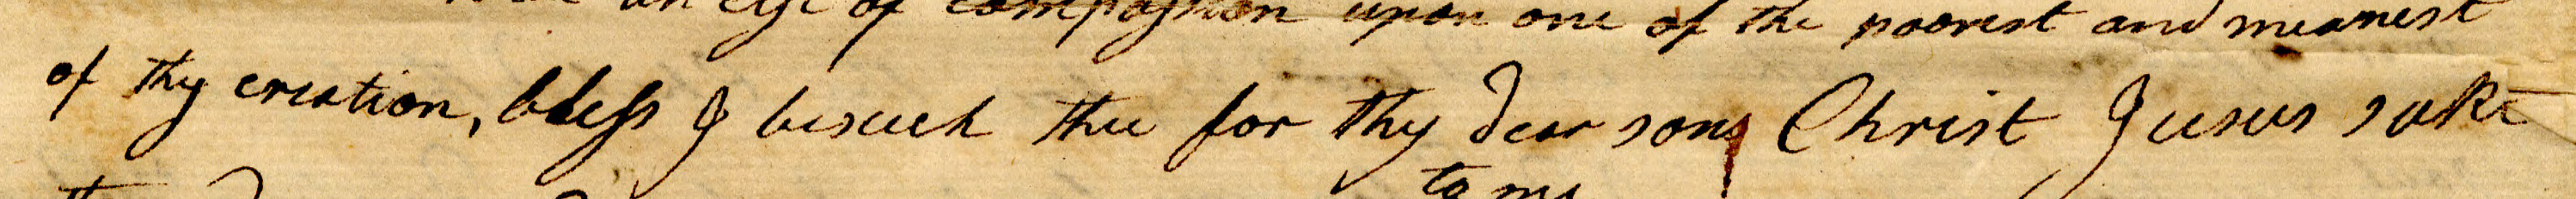of thy creation, bless I beseech thee for thy dear sons Christ Jesus take
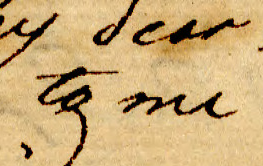to me
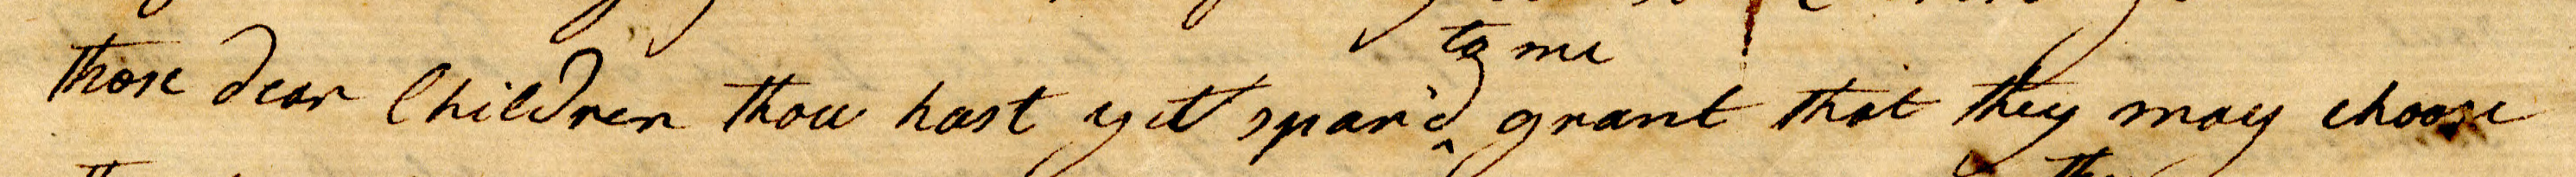those dear Children thou hast yet spar'd ^ grant that they may choose
